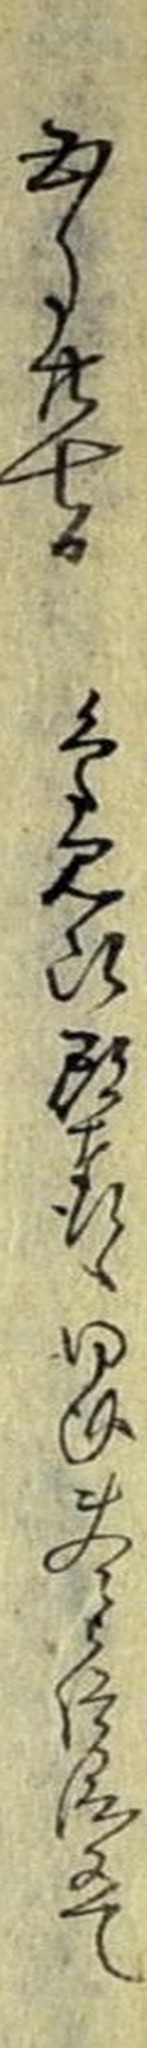五月廿七日鳥見頭郡奉行へ同趣夫々被仰渡有之
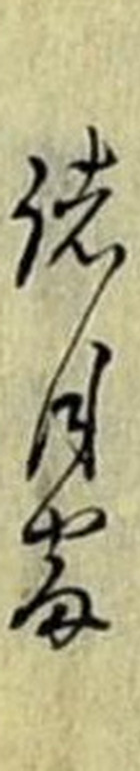諸月番
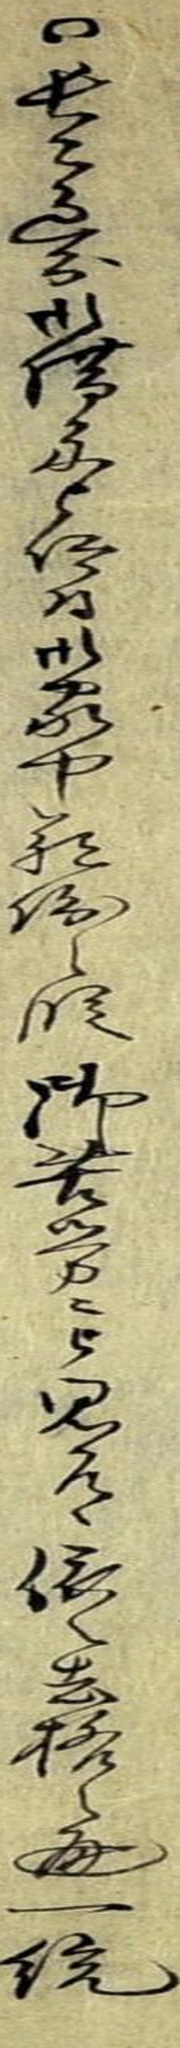〇長々過分御借米被仰付御家中難儀之段御苦労ニ被思召候依之去格之通一統
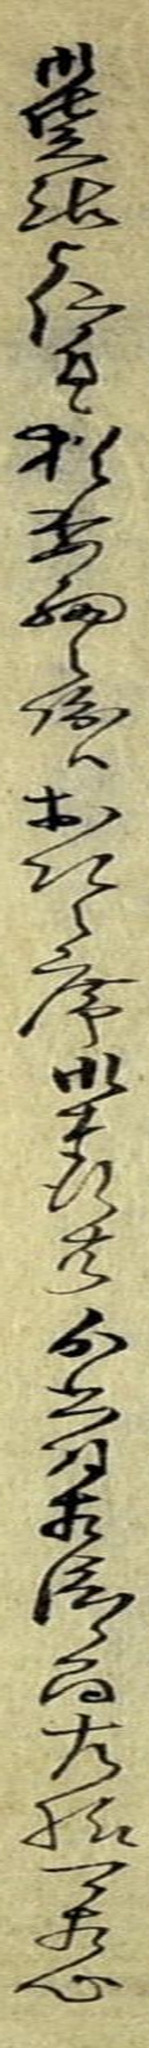御貸銀被仰付候猶委細之儀ハ於次之席御奉行共ゟ書付相渡候間左様可相心
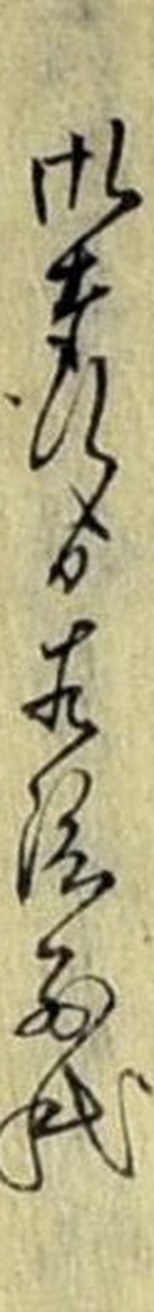御奉行ゟ相渡別紙
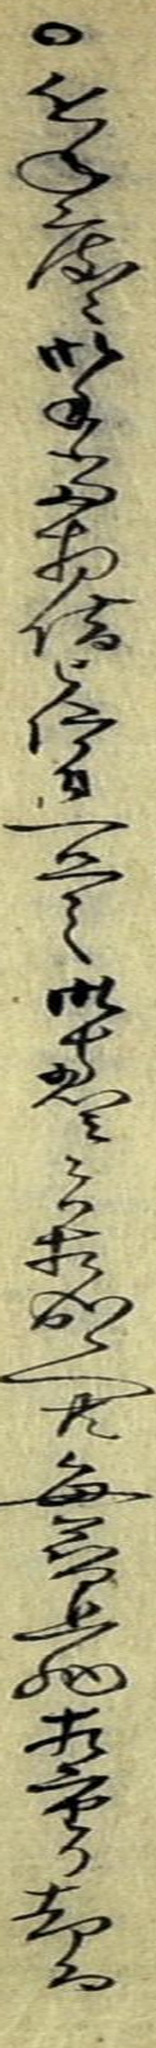〇近年度々御手当拝借被仰付一旦之御恵ミニハ相成候へ共毎暮上納相重り却而
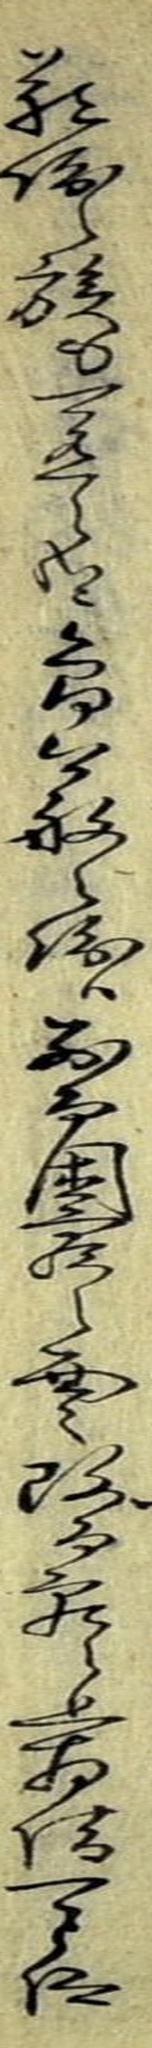難儀之族も可有之哉ニ候間今般之儀ハ別而困窮之面々改而願之上拝借可被仰
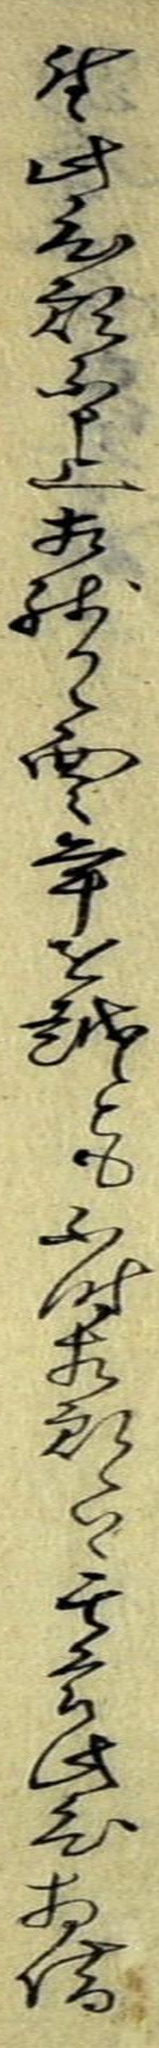付候此度願不申上相残り候面々年を越候とも不時相願候ハヽ其節此度拝借

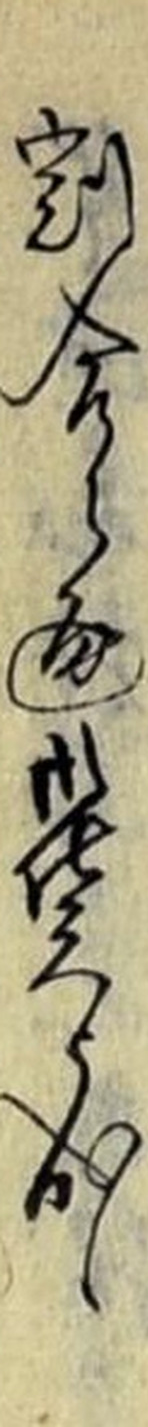割合之通御貸被成候
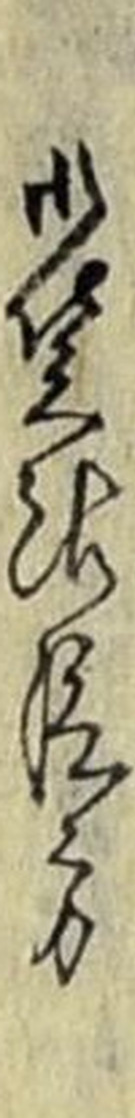御貸銀渡方
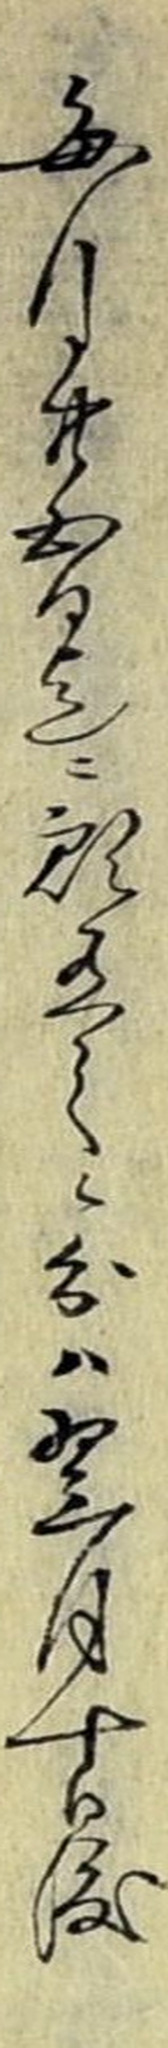毎月廿五日迄ニ願有之候分ハ翌月十日渡
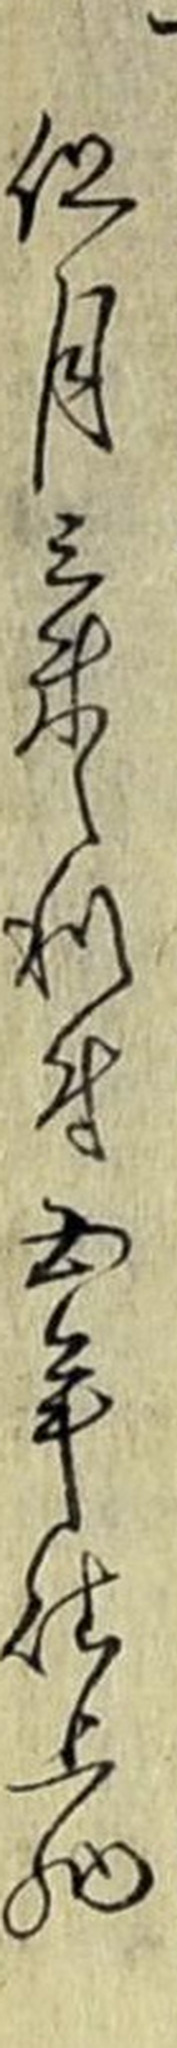但月三朱之利付五年賦上納
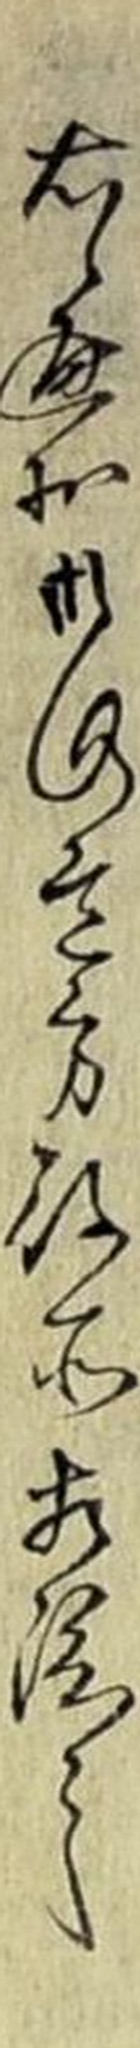右之通於御趣意方役所相渡之
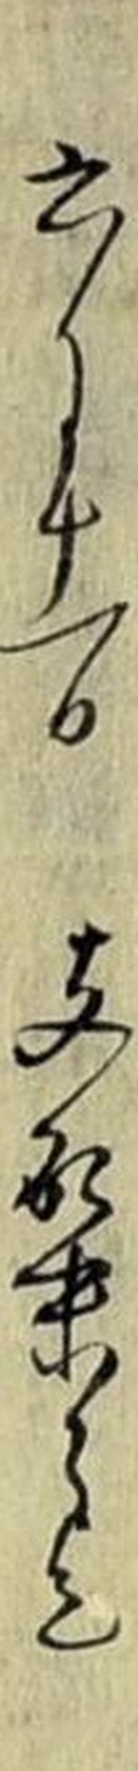六月十一日支配末々迄
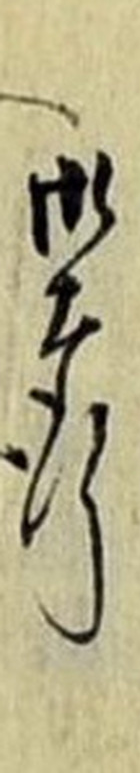御奉行
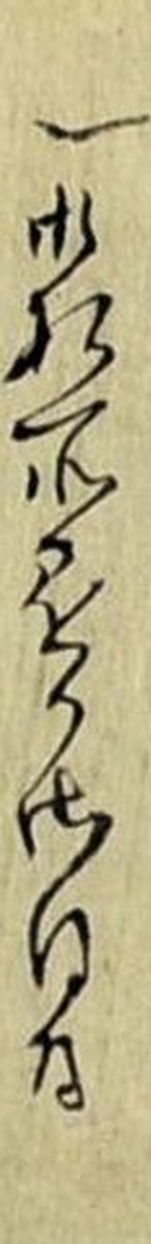御札所懸り御目付
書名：命令之部 三
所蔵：福井県文書館 Fukui Prefectural Archives
